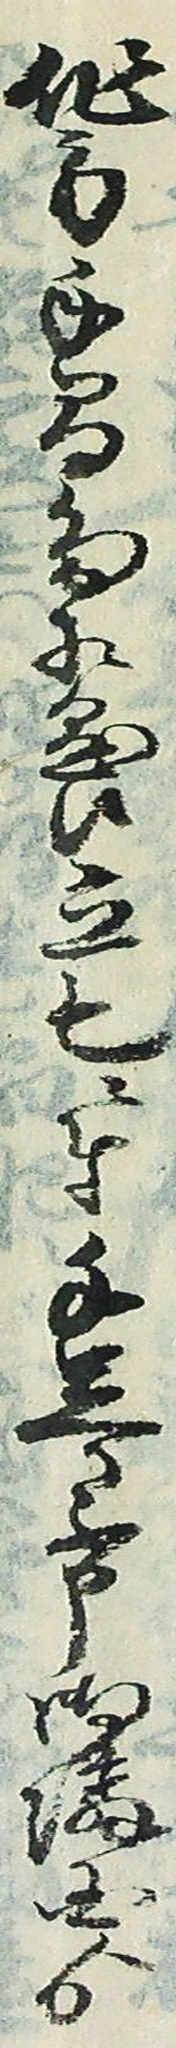作方手間多相懸候立毛に付手足り不申御隣国ゟ
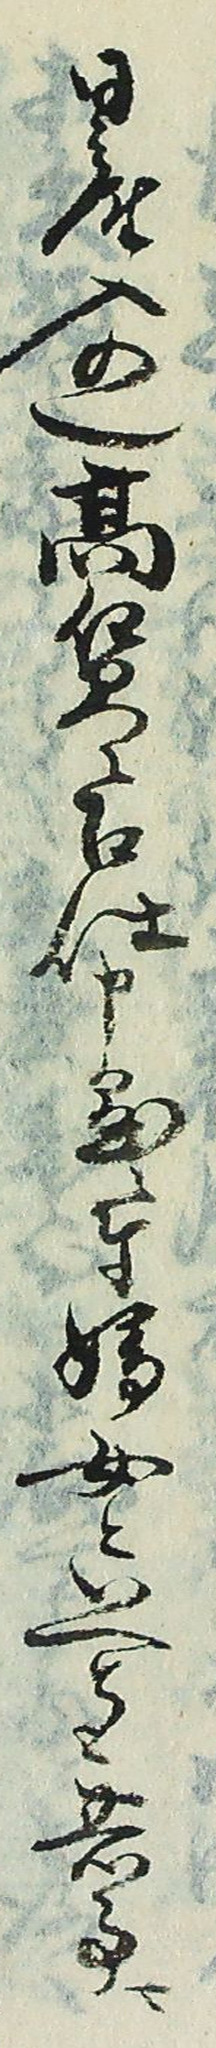日雇入込高賃に召仕申懸に付婦女といへとも其事に
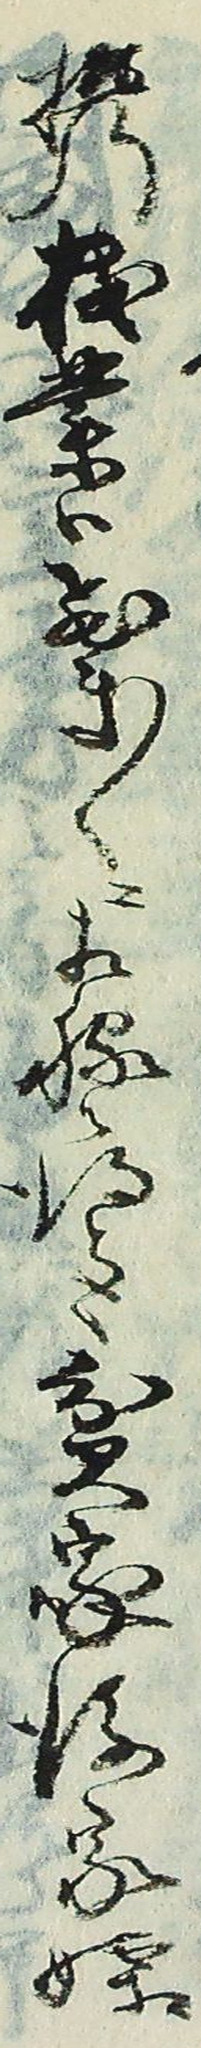携機業はひま〳〵に相稼候得とも貧家後家嫁
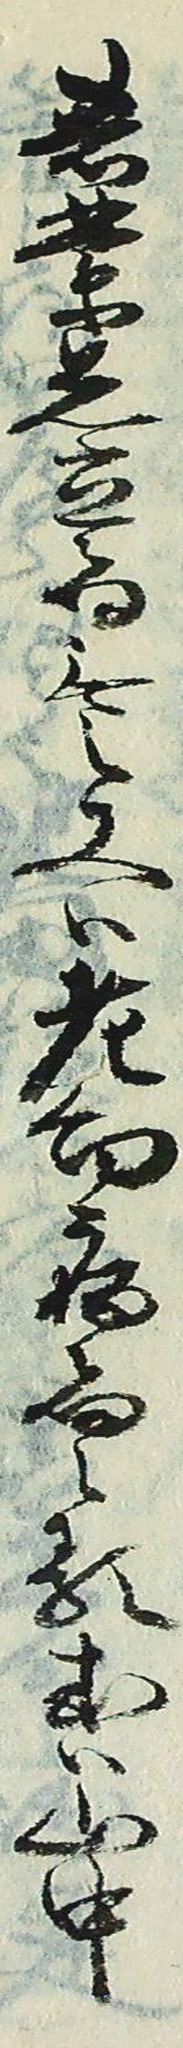農業覚先立者無之又は老幼病者之類或は山中
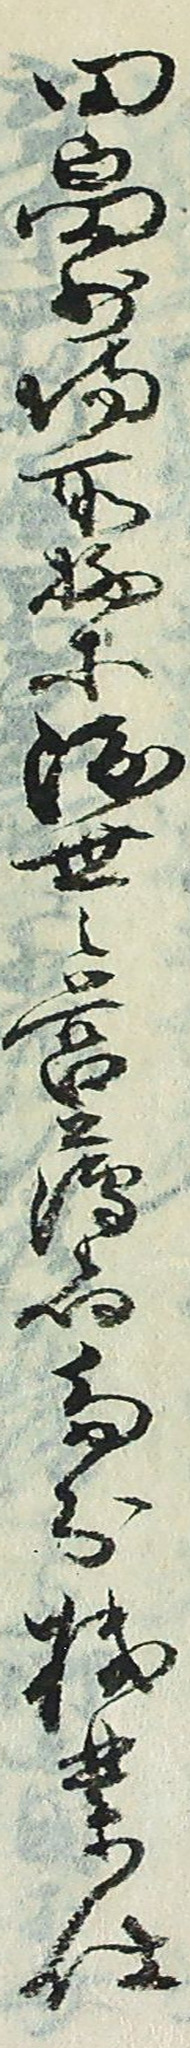田畠少場所柄等渡世之営薄者多分機業仕
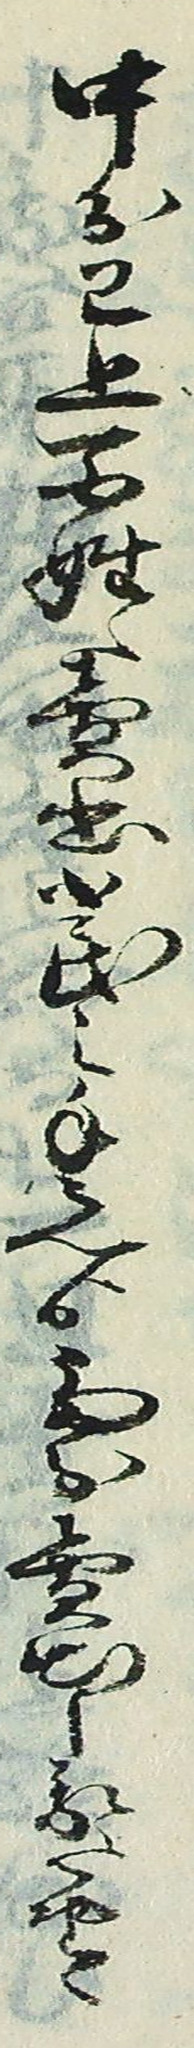中分已上百姓へ売出小民之手元ゟ多分売出申義に御坐候
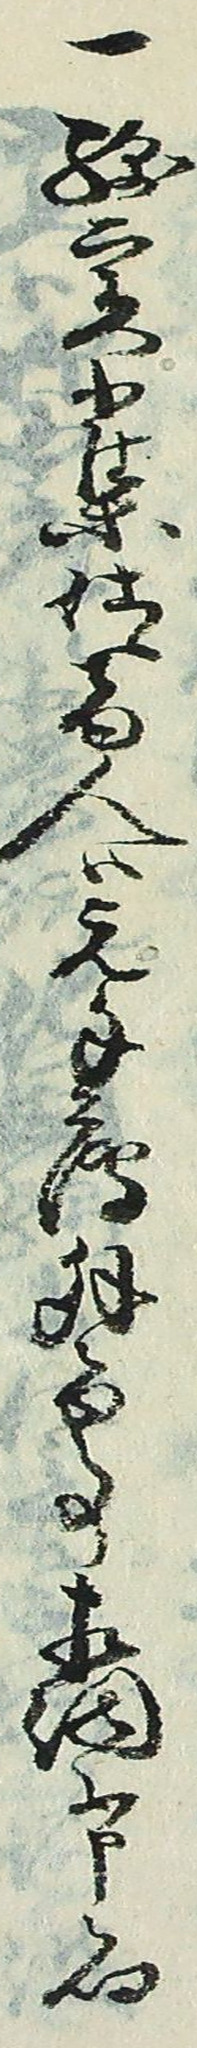一綿実小集仕候商人は元手薄外商事相調不申者
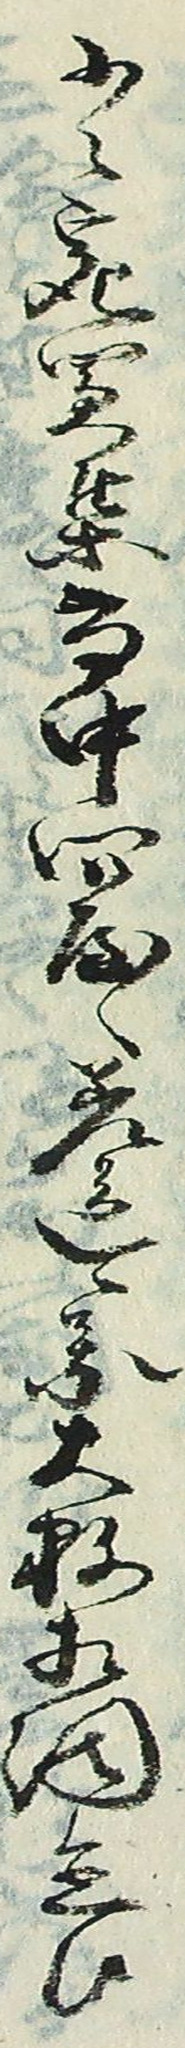少々宛買集市中問屋へ差送候義大数相調置候
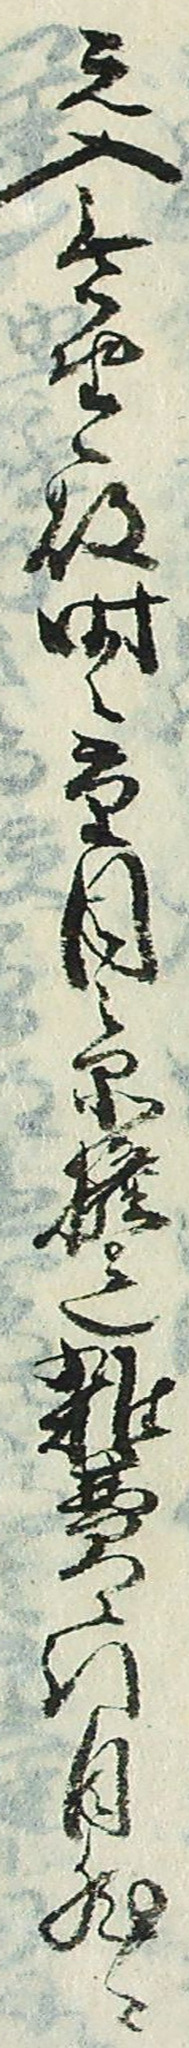元入無御坐候故時々重目之品擔迄雑費に引自然に
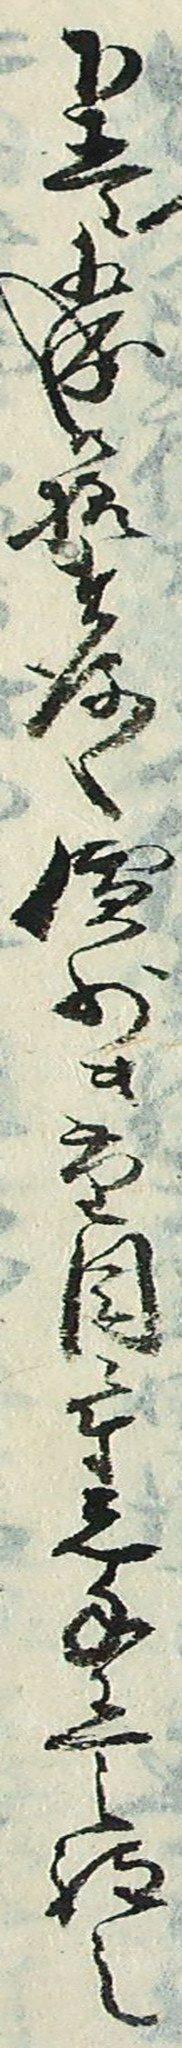下直に相成候様奉存候価少き重目に付元手有之程之
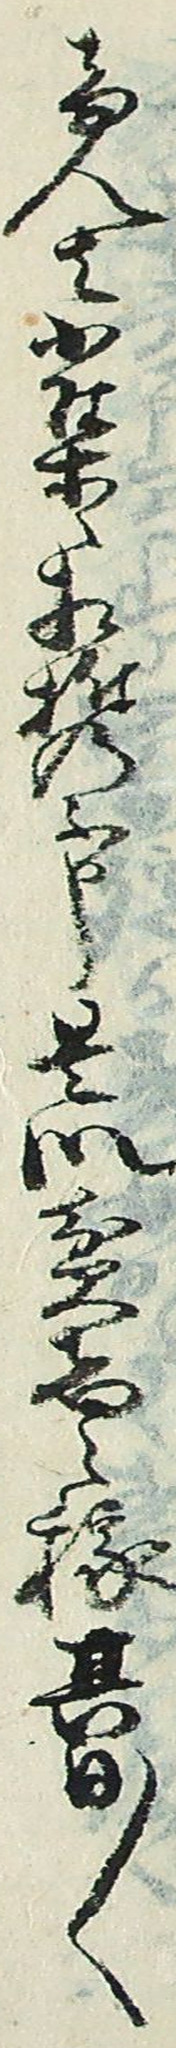商人者小集に相携不申是以貧者之稼其日〳〵

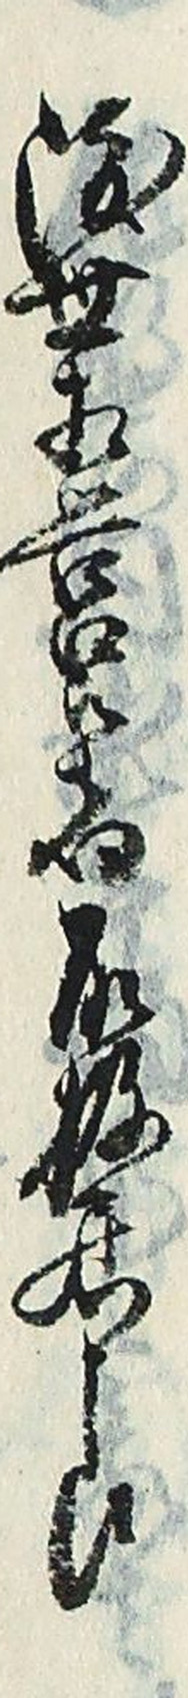渡世相営候者取扱居申候
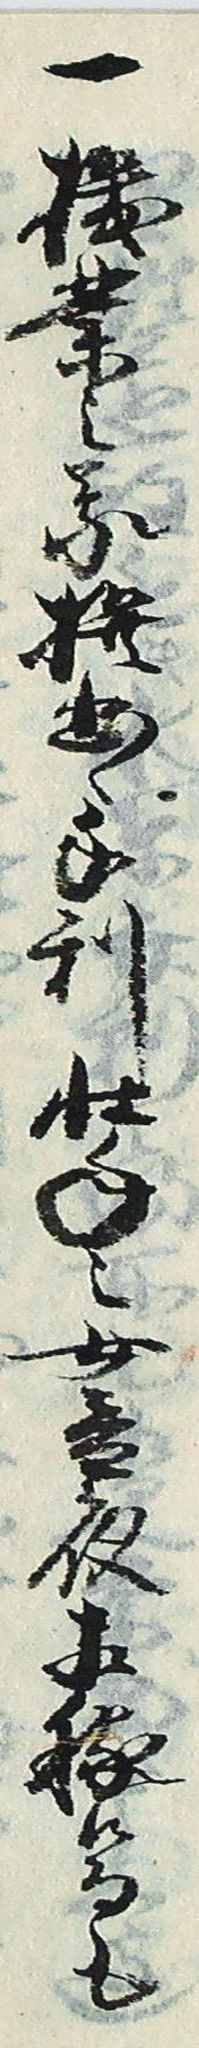一機業之義撰出候手利壮年之女昼夜相稼候而も
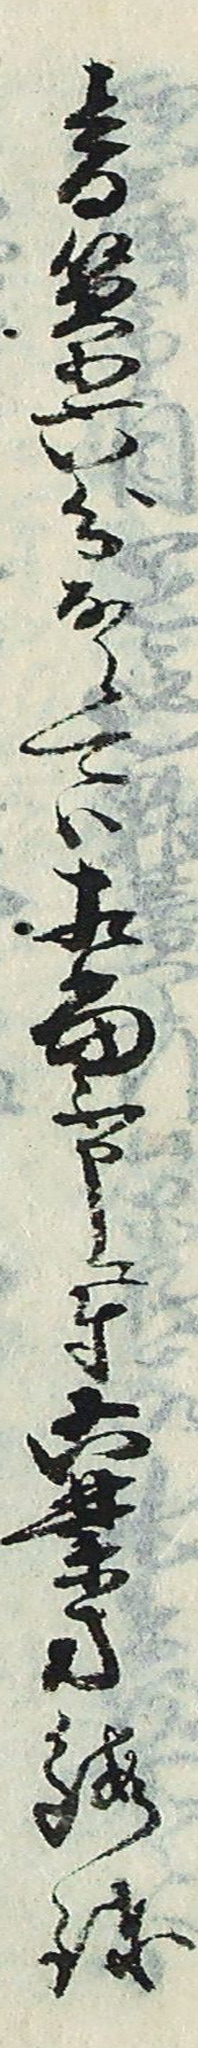壱日賃五六分ならては相当不申に付右業方鍛銭
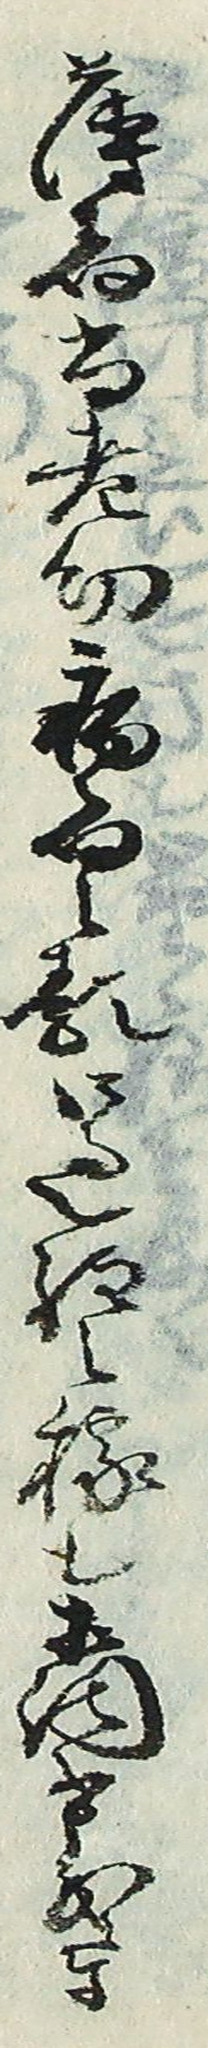薄者当老幼病者之類口過程之稼も相調不申義に付
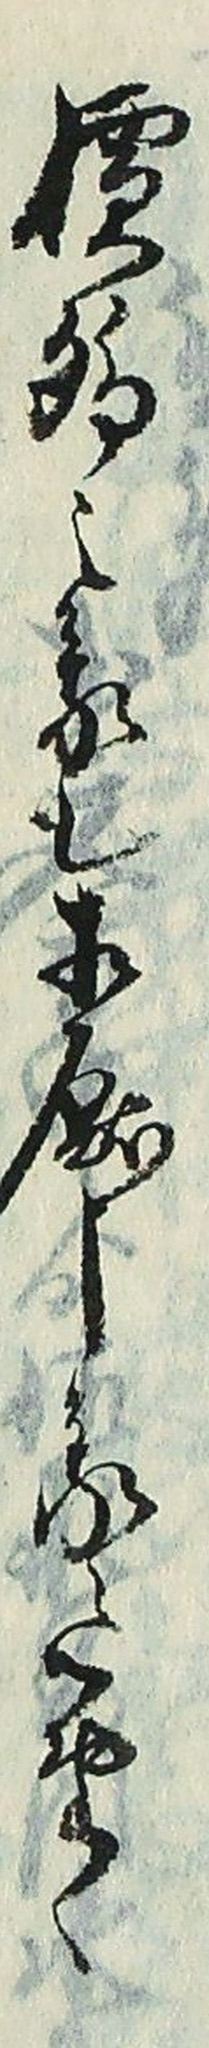価聊之義も相厭申義に御坐候
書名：油稼御取究ニ附御箇條書テ以被仰渡南北同役申談御答書控
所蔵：鳴門教育大学 Naruto University of Education
